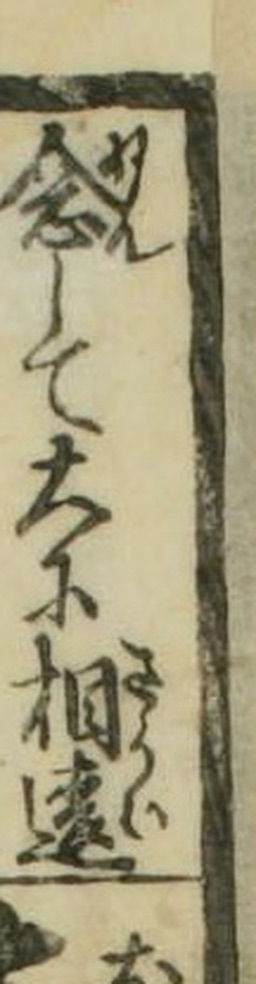念して大に相違
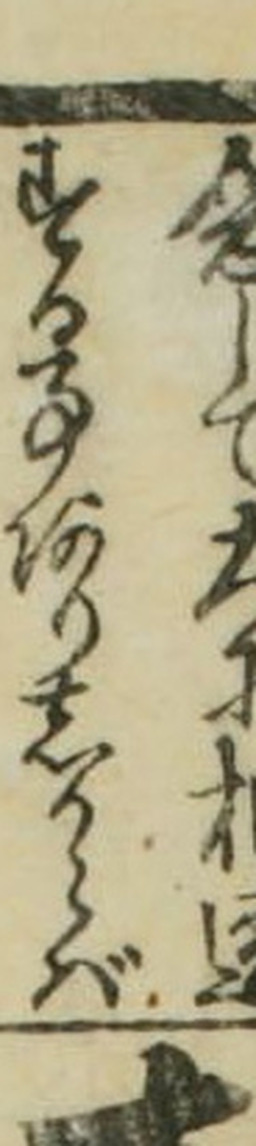する事ありしからば
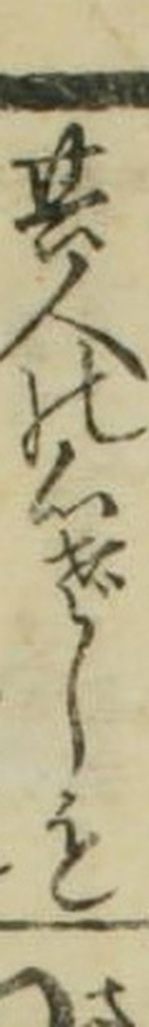其人の心ざしも
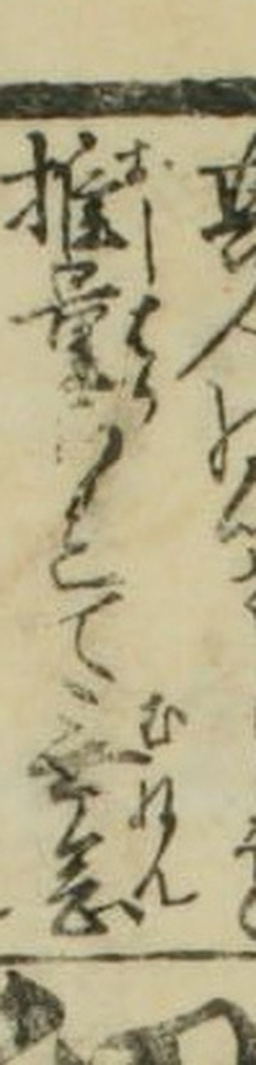推量られて無念
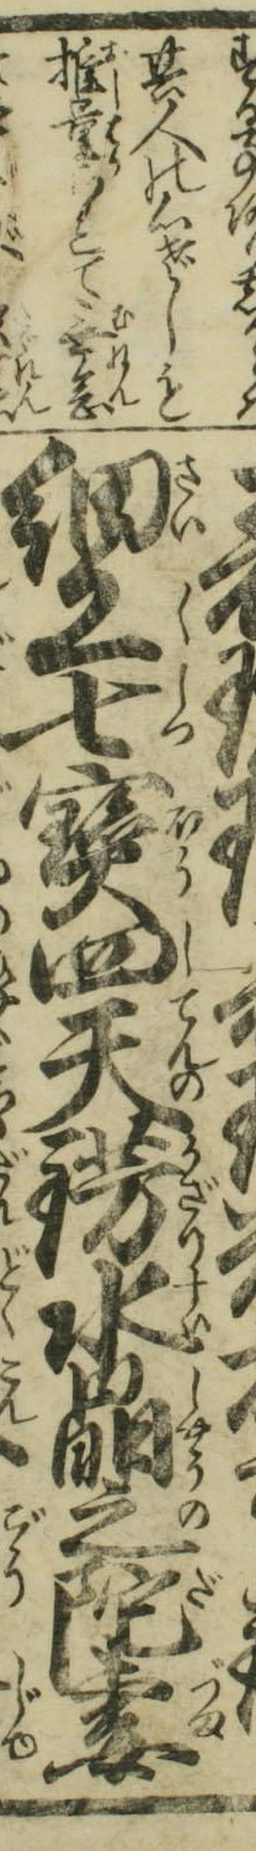細工七寶四天錺水晶之陀妻
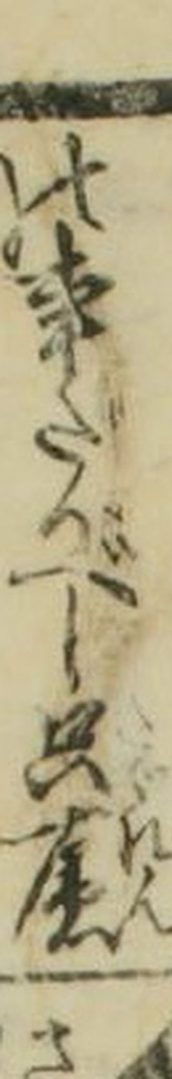の事たるべし只廉
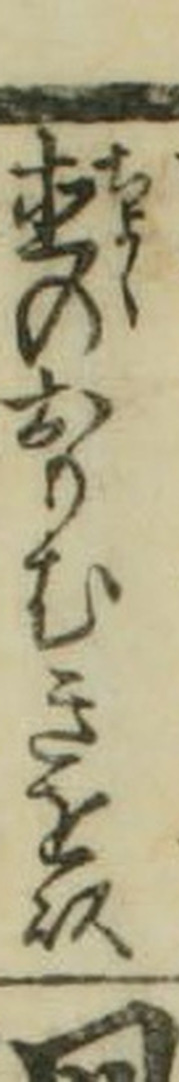直のおもむきを以
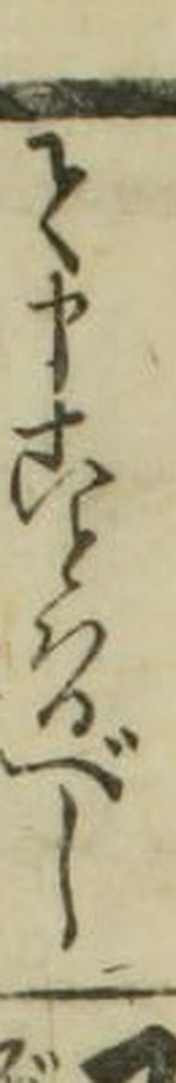て申ことはるべし
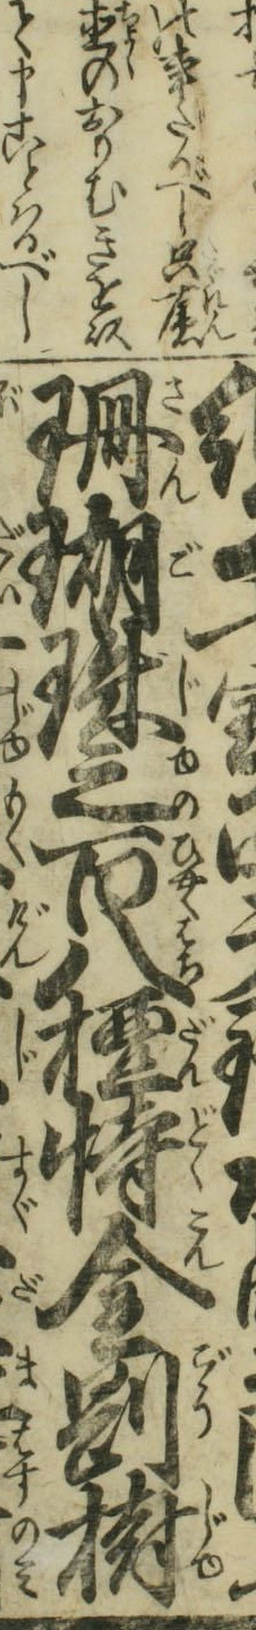珊瑚珠之百八檀特金剛樹
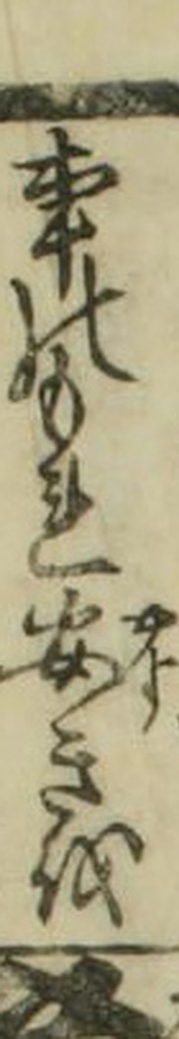事のもれ安きを
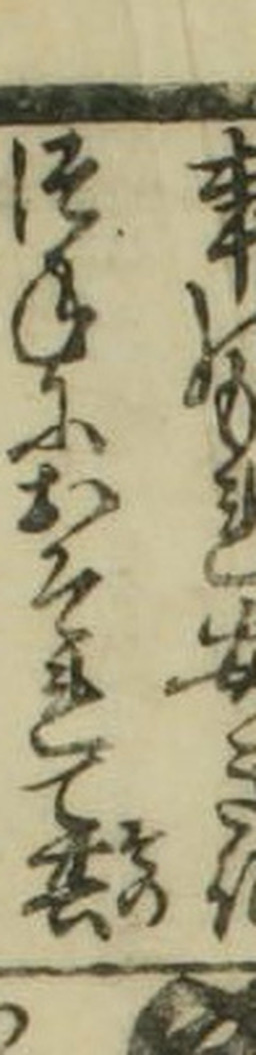つねにおそれて其
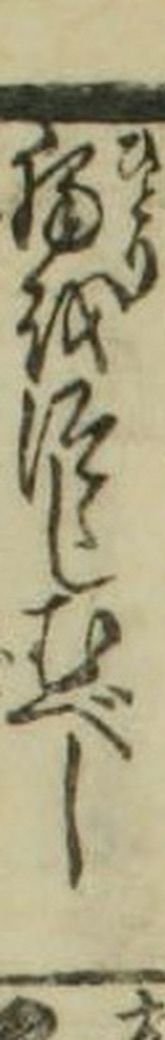独をつゝしむべし
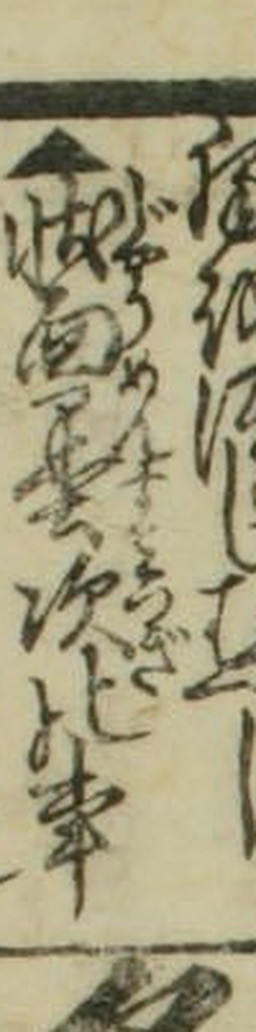▲状面墨次の事
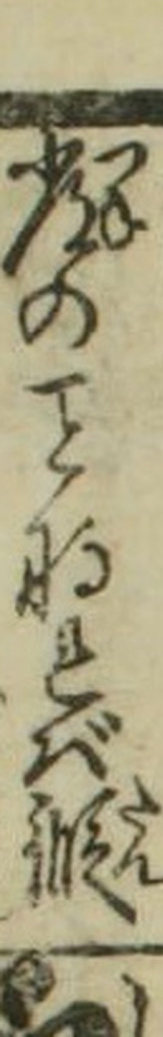常のことなれば鍛
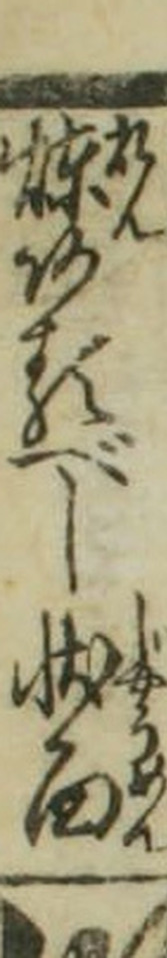煉あるべし状面

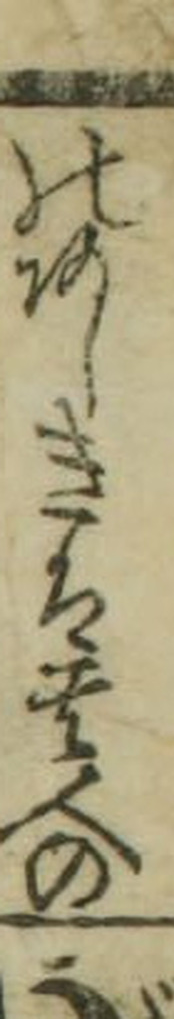のあしきは其人の
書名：増補職人往来
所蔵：東京学芸大学教育コンテンツアーカイブ
